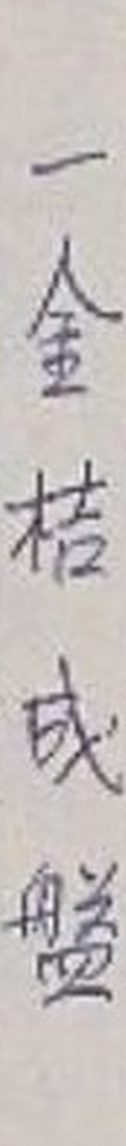一種茶成箱一金桔成盤
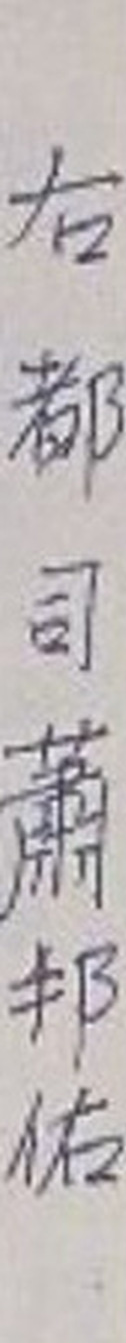右都司蕭邦佑
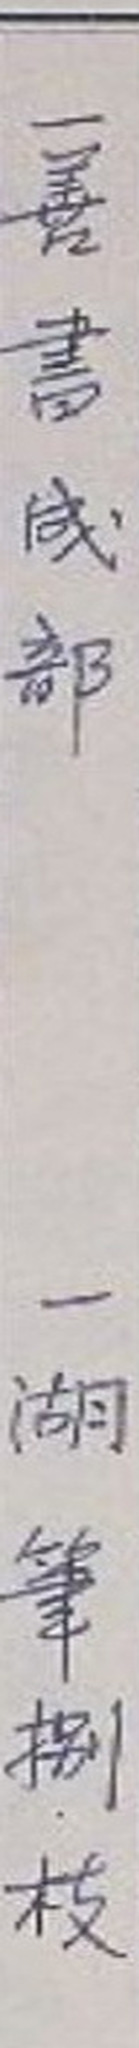一善書成部一湖筆捌枝
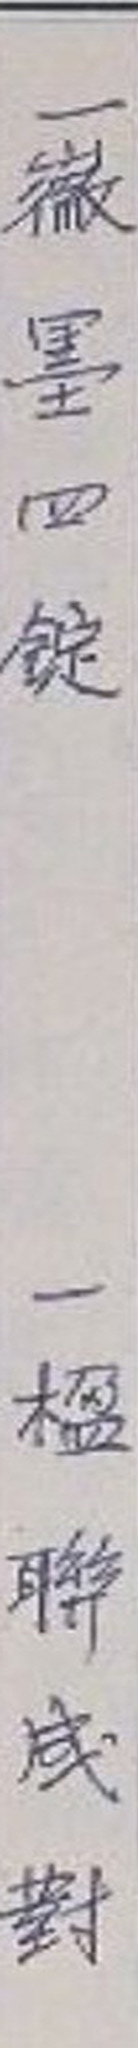一徽墨四錠一楹聯成対
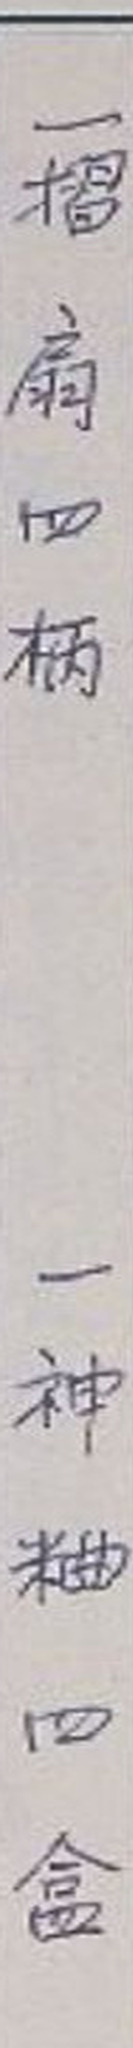一摺扇四柄一神粬四盒
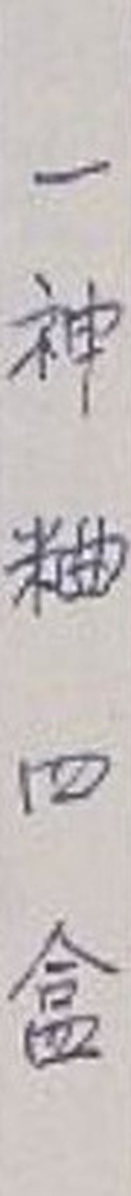一摺扇四柄一神粬四盒
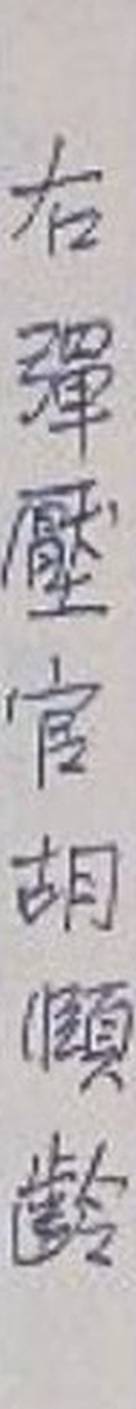右弾圧官胡頥齢
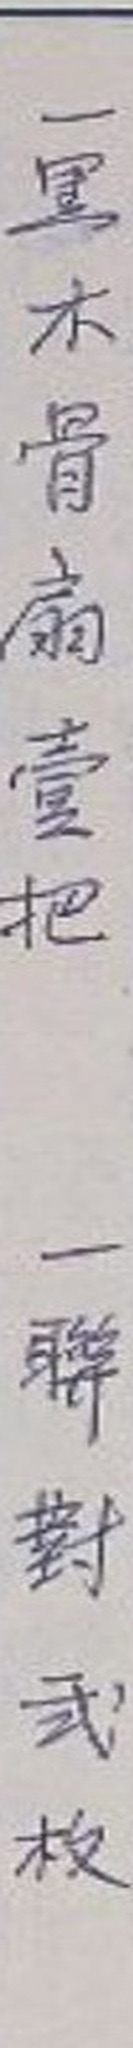一黒木骨扇壱把一聯対弐枚
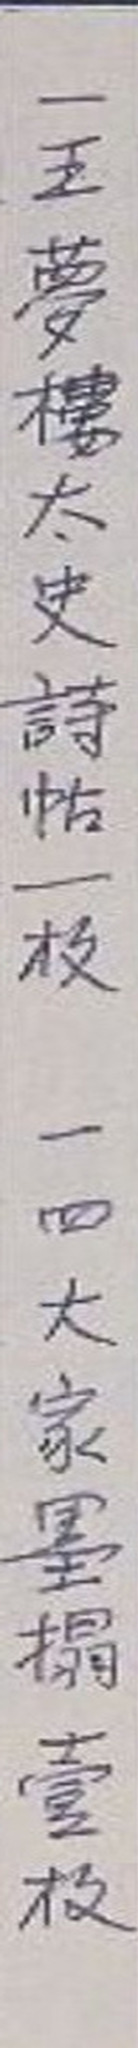一王夢楼太史詩帖一枚一四大家墨榻壱枚
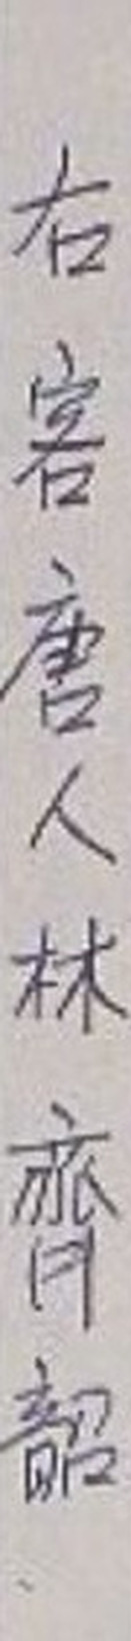右客唐人林齊韶
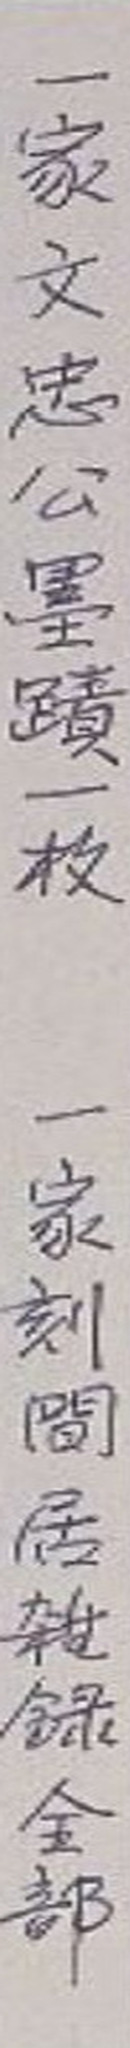一家文忠公墨蹟一枚一家刻間居雑録全部
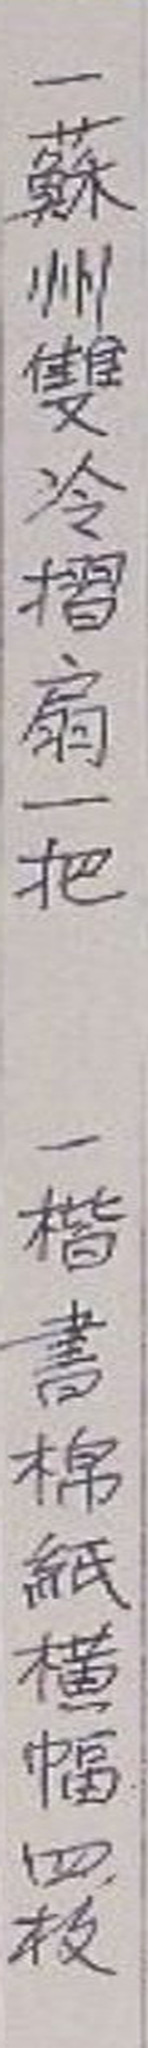一蘇州雙冷摺扇一把一楷書棉紙横幅四枚

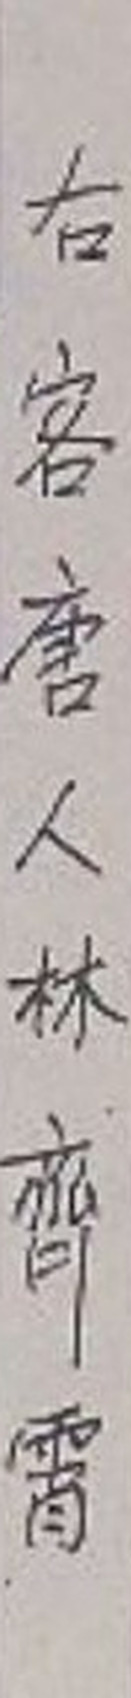右客唐人林齊霄
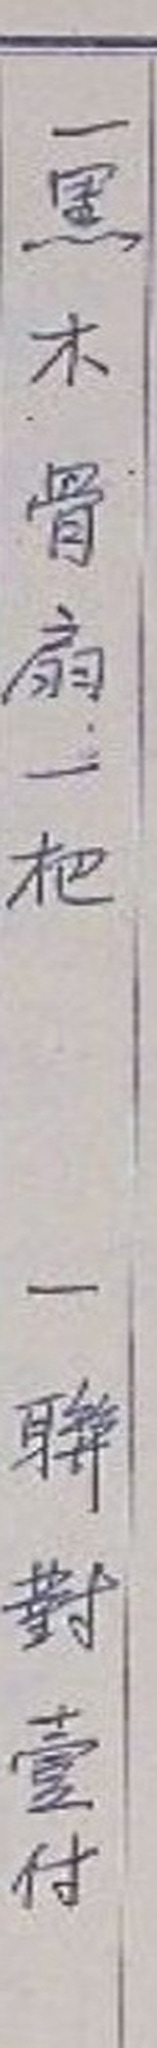一黒木骨扇一把一聯対壱付
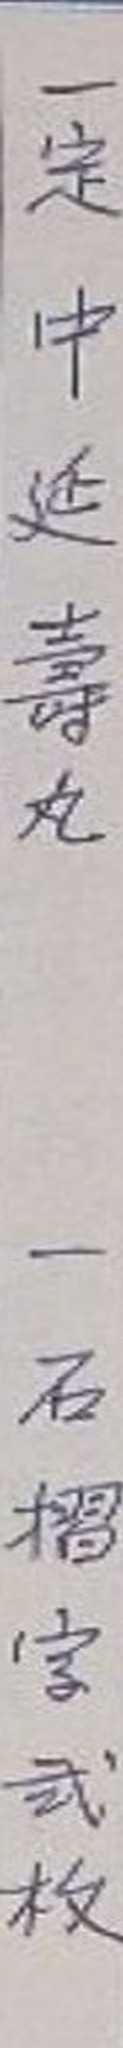一定中延寿丸一石摺字弐枚
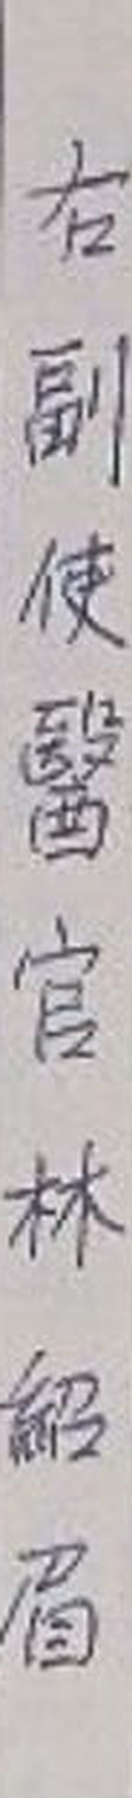右副使医官林紹眉
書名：支那冊封使来琉諸記 下巻
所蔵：University of the Ryukyus Library
